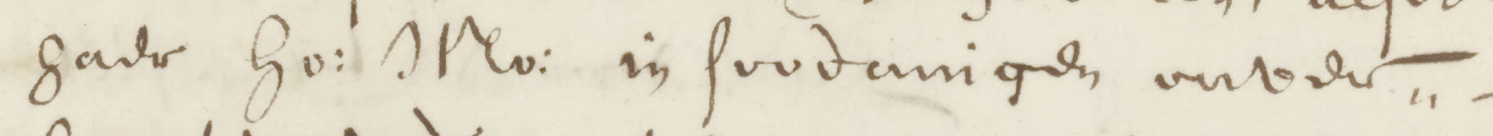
haer ho:Mo: in soodanigen onver„
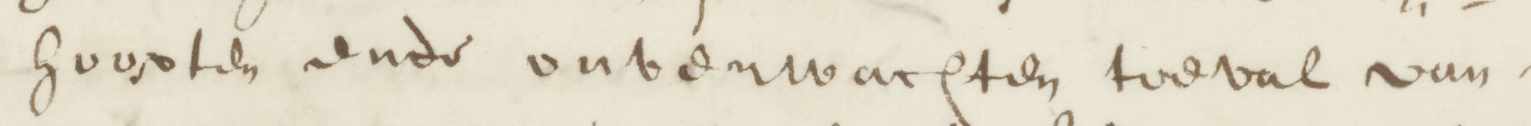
hoopten ende onverwachten toeval van
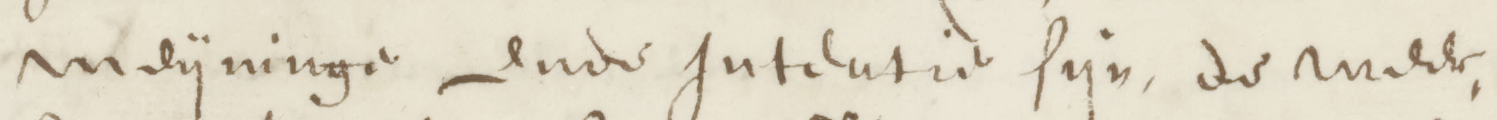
meijninge ende intentie sijn, de meer„
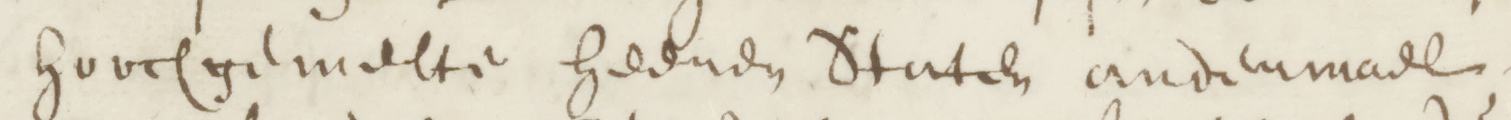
hoochgemelte heeren Staten andermael
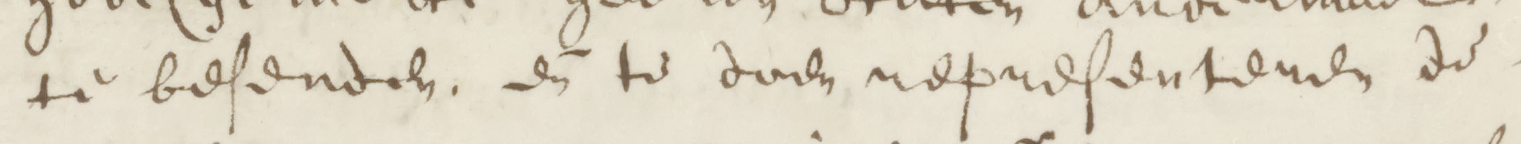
te besenden, en te doen representeren de
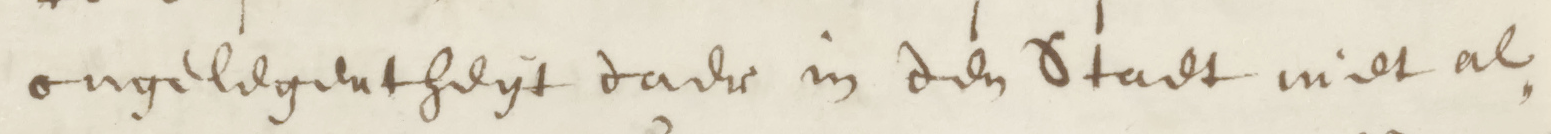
ongelegentheijt daer in den Staet niet al„
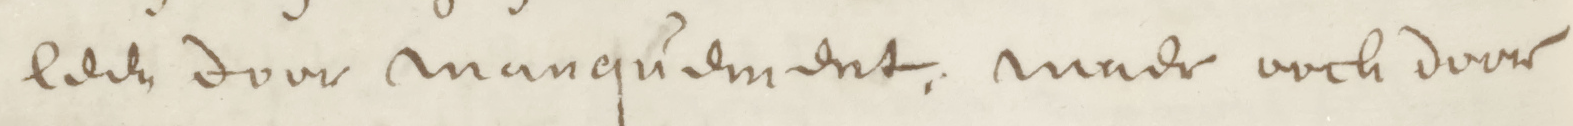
leen door manquement, maer oock door
